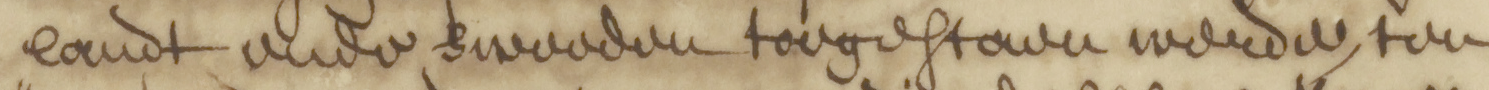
,,landt ende Sweeden toegestaen werde, ten
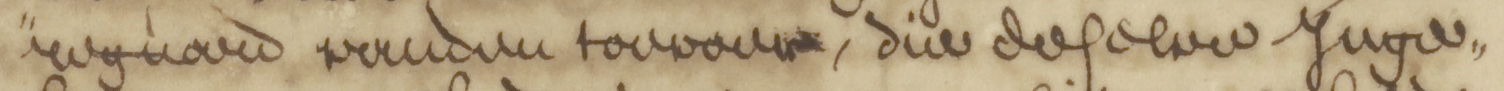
reguard vanden toevoer, die deselve inge,,
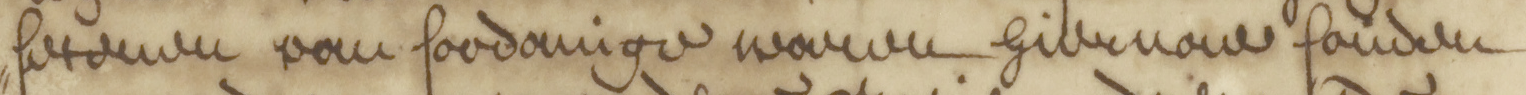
,,setenen van soodanige waren hiernae souden
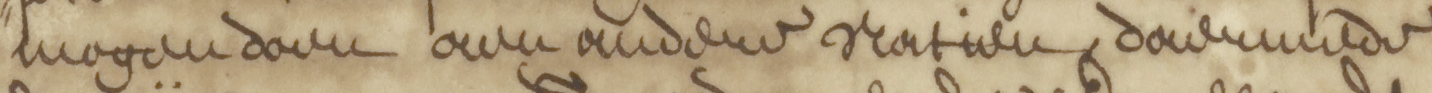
mogendoen aen andere Natien, daermede
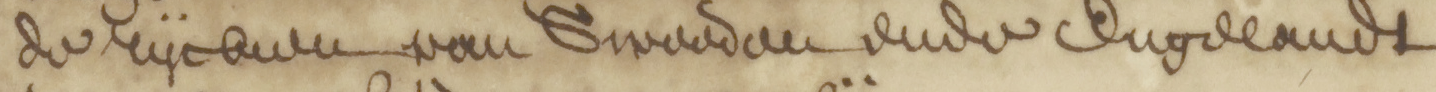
de rijcken van Sweeden ende Engelandt
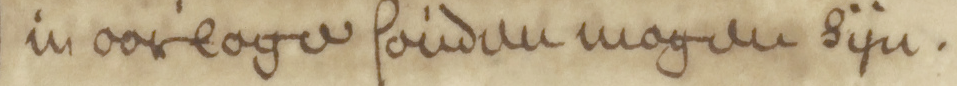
in oorloge souden mogen sijn.
